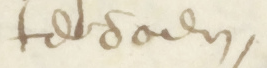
te doen.
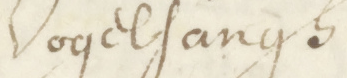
Vogelsangh
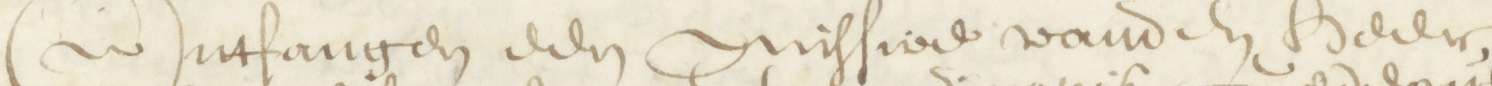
Ontfangen een Missive vanden Heer
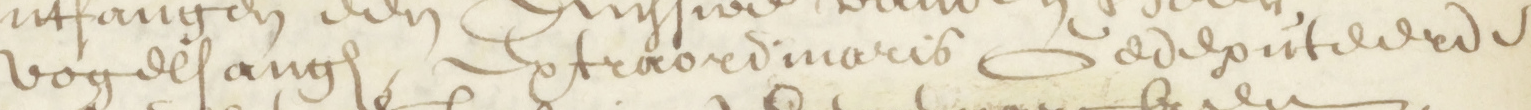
vogelsangh Extraordinaris Gedeputeerde
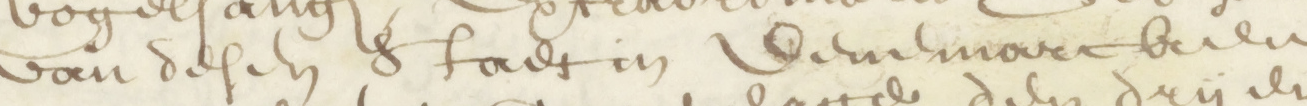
van desen Staet in Denemarcken,
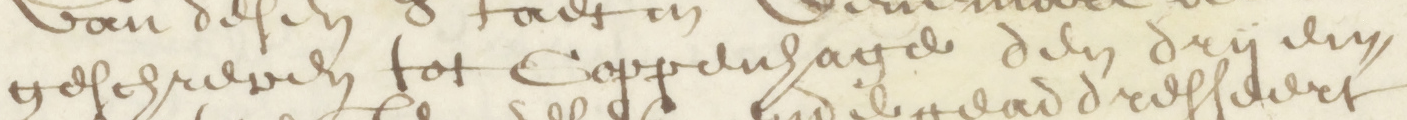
geschreven tot Coppenhage den drijen„
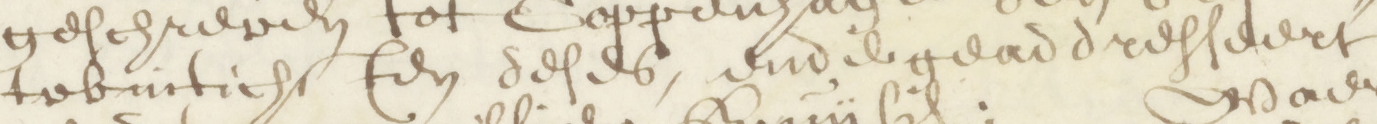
twintichsten deses, ende geaddresseert
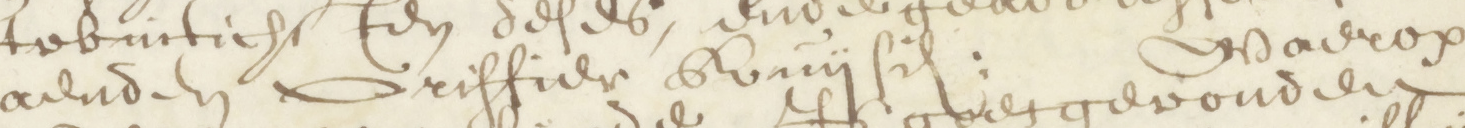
aenden Griffier Ruijsch: Waerop
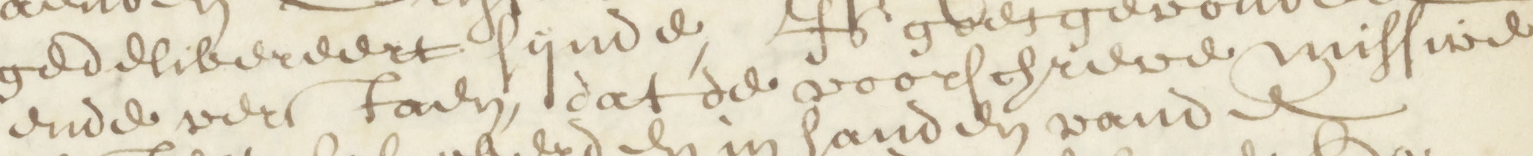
ende verstaen, dat de voorschreve missive
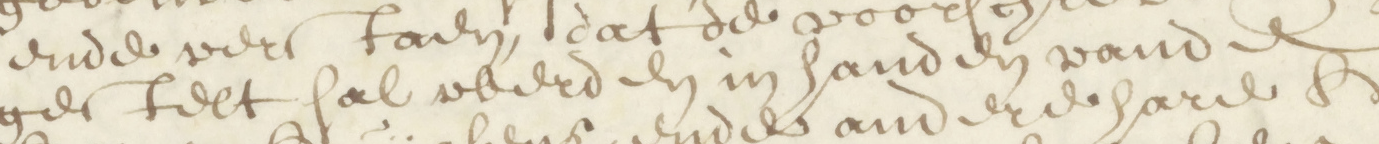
gestelt sal werden in handen vande
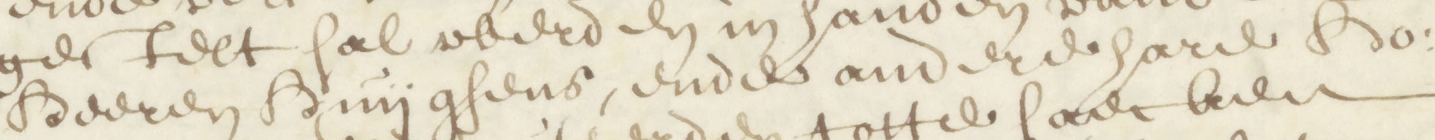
Heeren Huijghens, ende andere hare Ho:
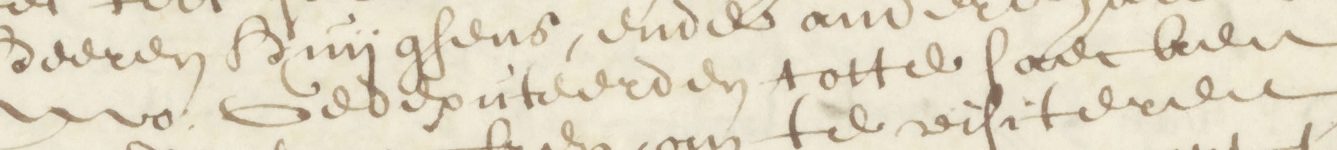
Mo: Gedeputeerden totte saecken
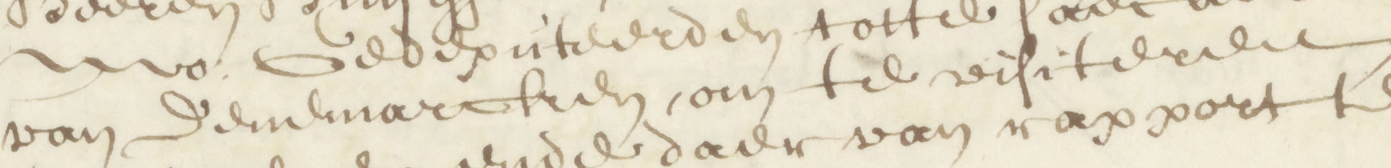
van Denemarcken, om te visiteren,
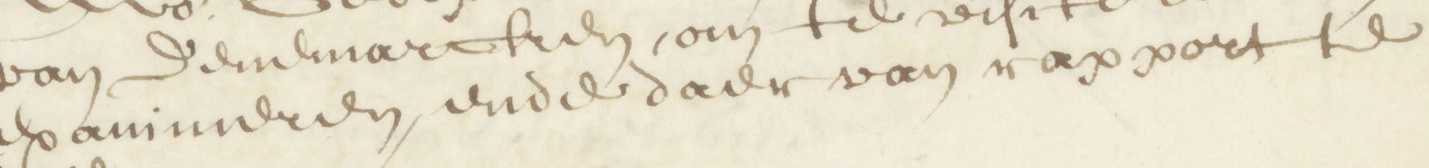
examineren, ende daer van rapport te
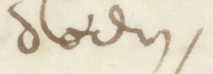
doen.
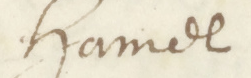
Hamel
